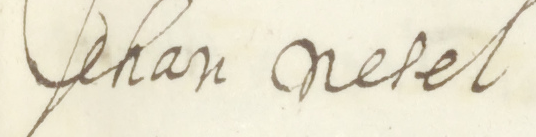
Jehan nesel
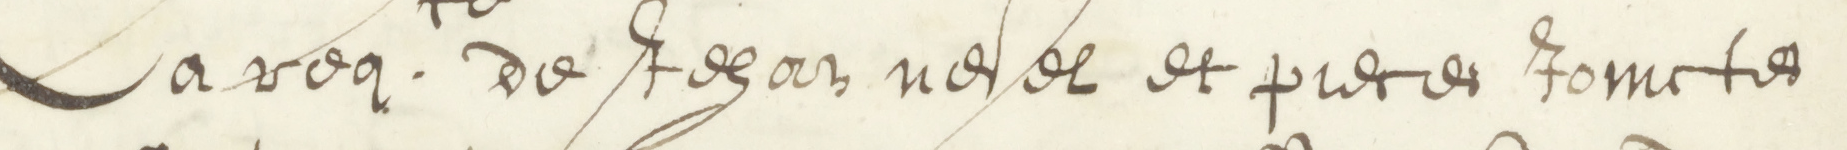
La reqte. de Jehan nesel et pieres Joinctes
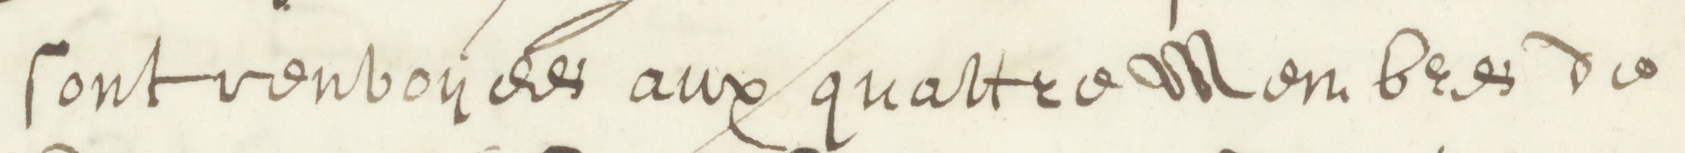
sont renvoyees aux qualtre Membres de
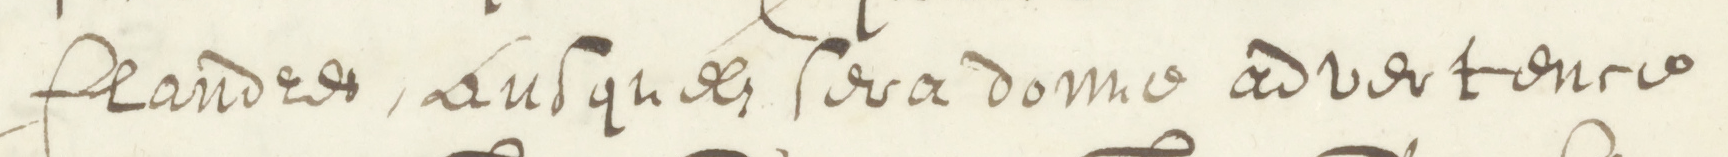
Flandres, ausquelz sera donne advertence
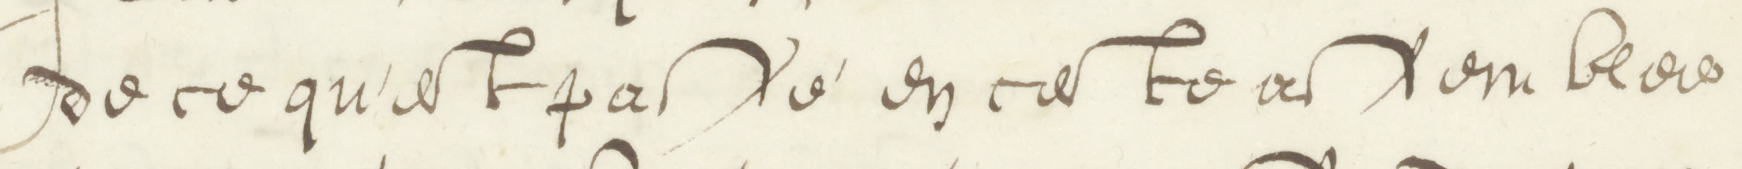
de ce qu‛est passé en ceste assemblee
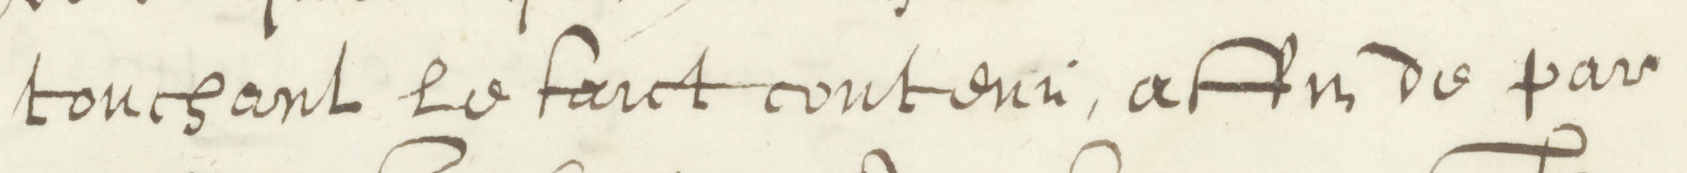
touchant le faict contenu, affin de par
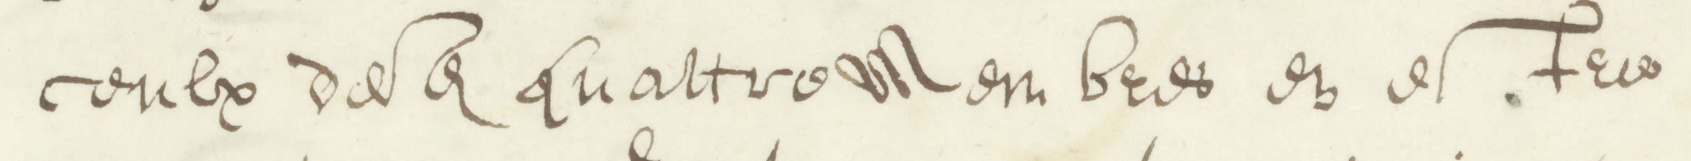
ceulx desd qualtre Membres en estre
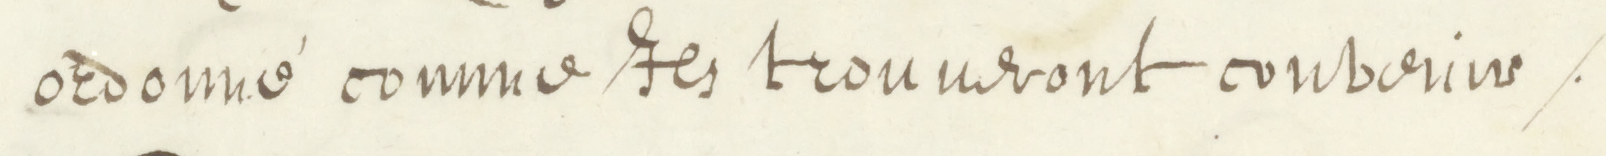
ordonné comme Ilz trouueront convenir.
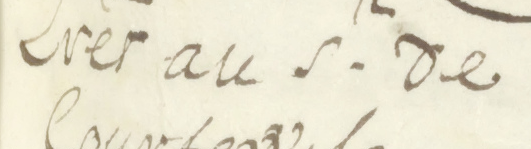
Lres au sr. de
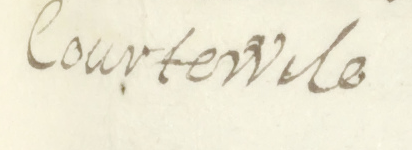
Courtewile
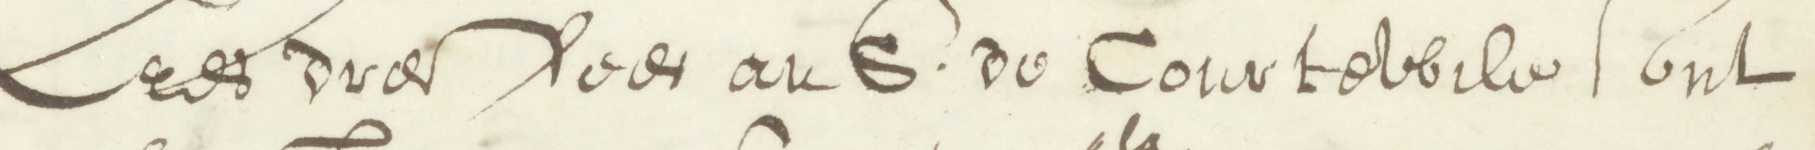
Lres dressees au Sr. de Courtewile sont
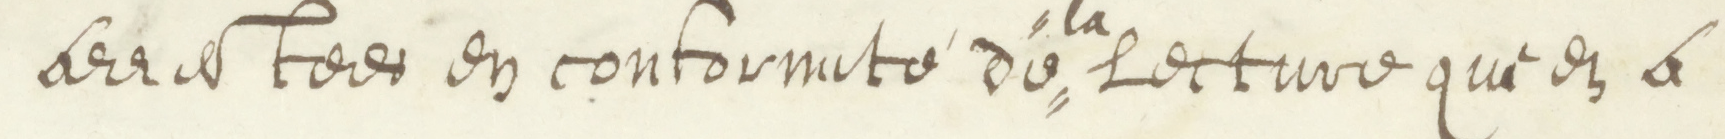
arrestees en conformté de„la„ lecture que en a
